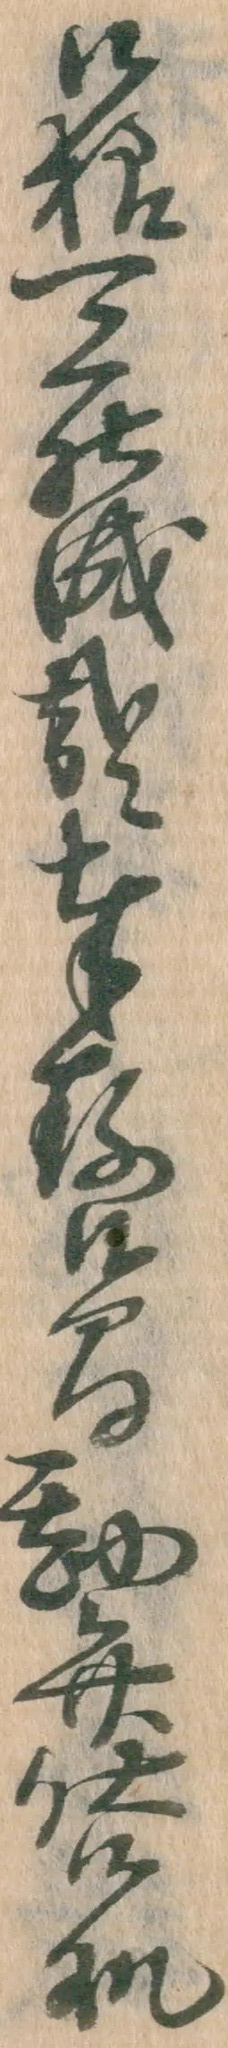候様可罷成哉ニ奉存候間勘弁仕候処
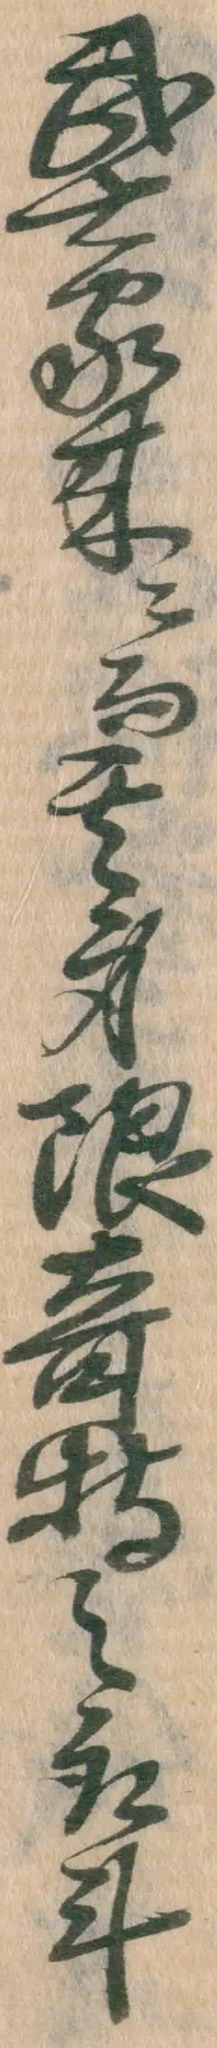武士家来ニ而其身限奇特之取計
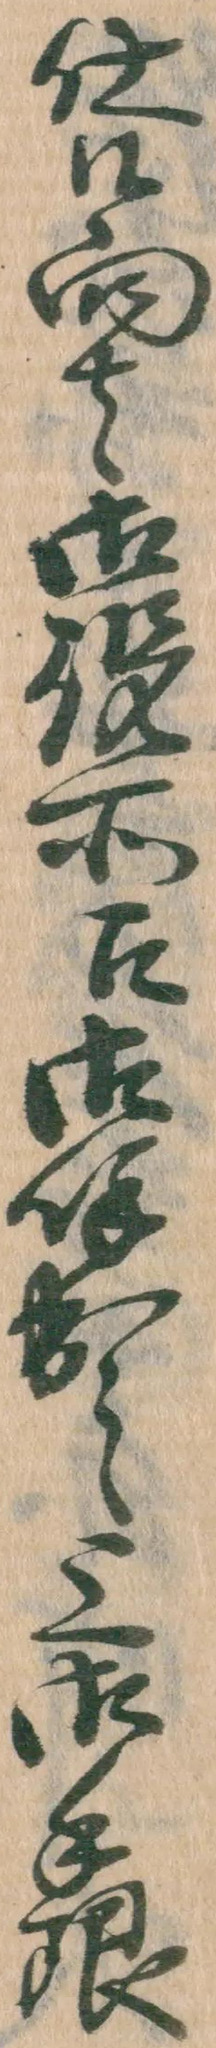仕候向は御役所え御呼出之上御手限
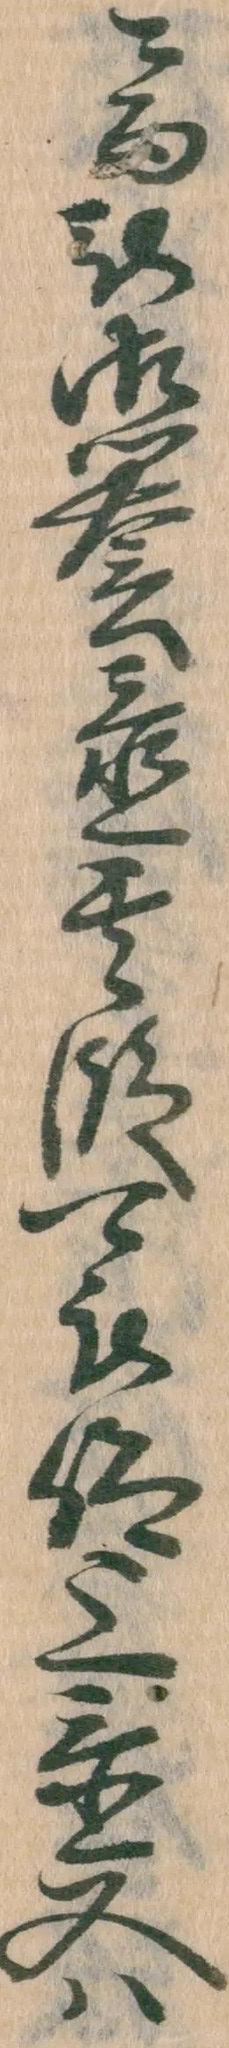ニ而被御誉置其段可被仰上置又ハ
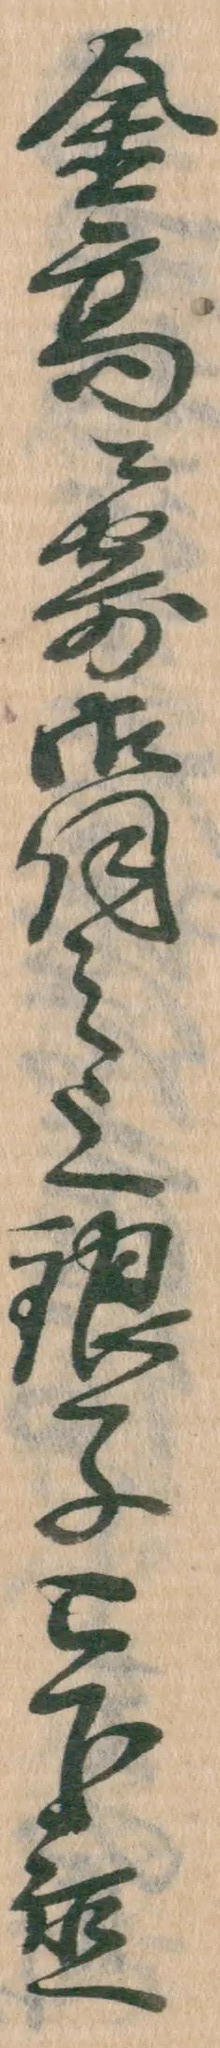金高ニ寄御伺之上銀子被下置
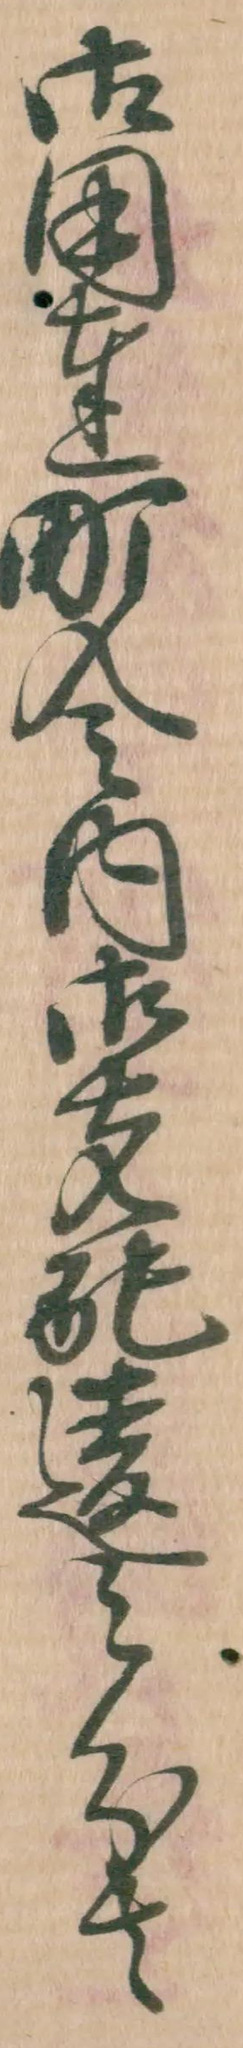御用達町人之内御支配違之分は
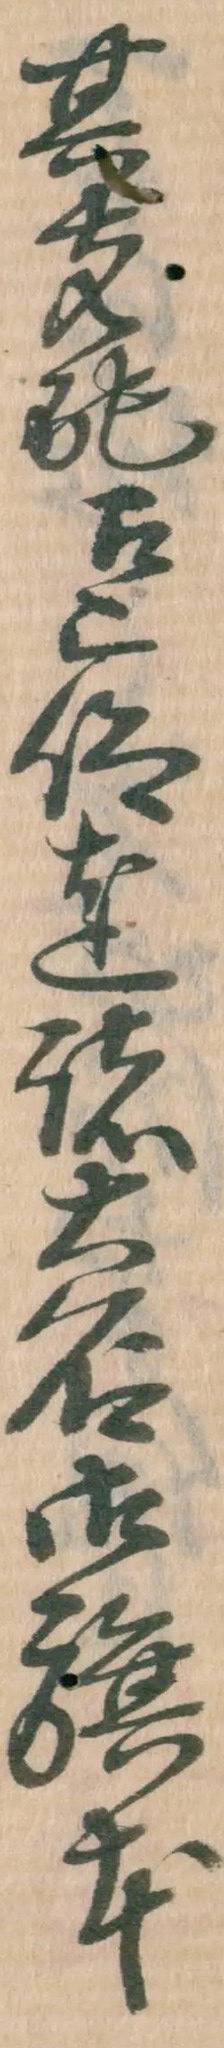其支配え被仰達諸大名御旗本
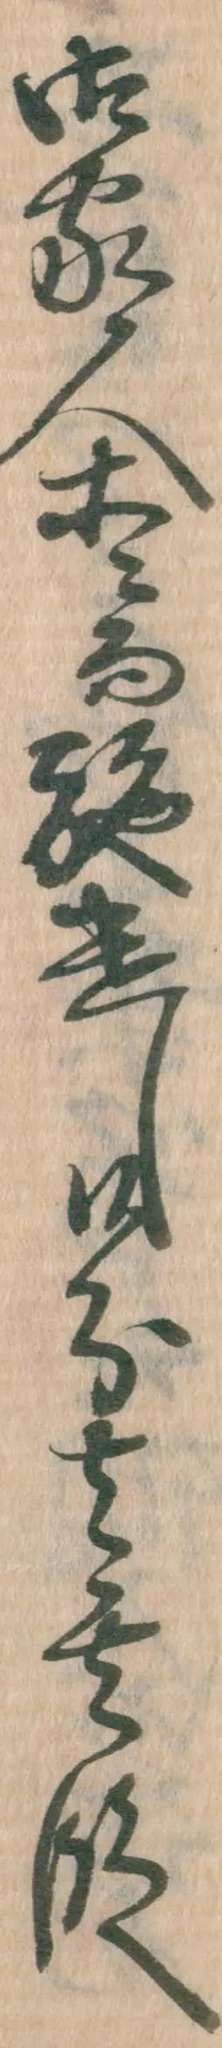御家人等ニ而施遣し候分は其段
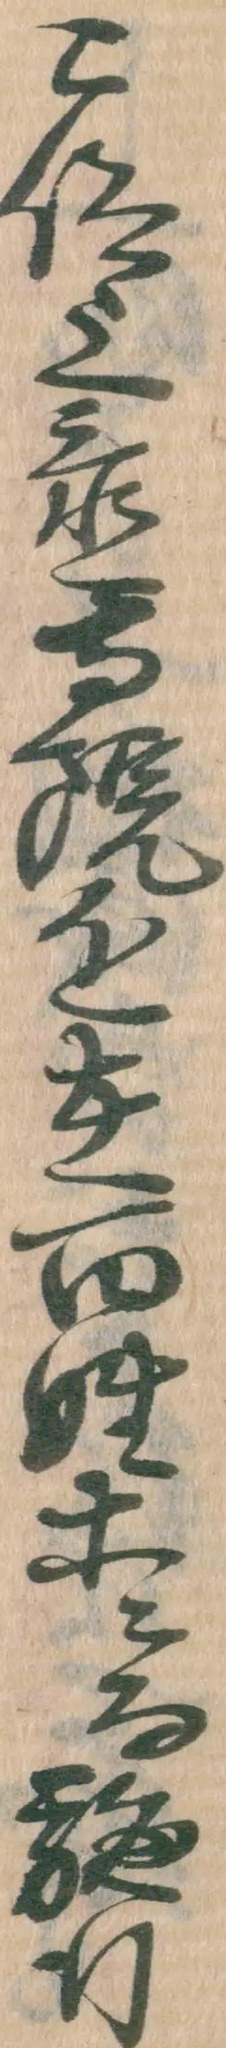被仰上置寺院近在百姓等ニ而施行
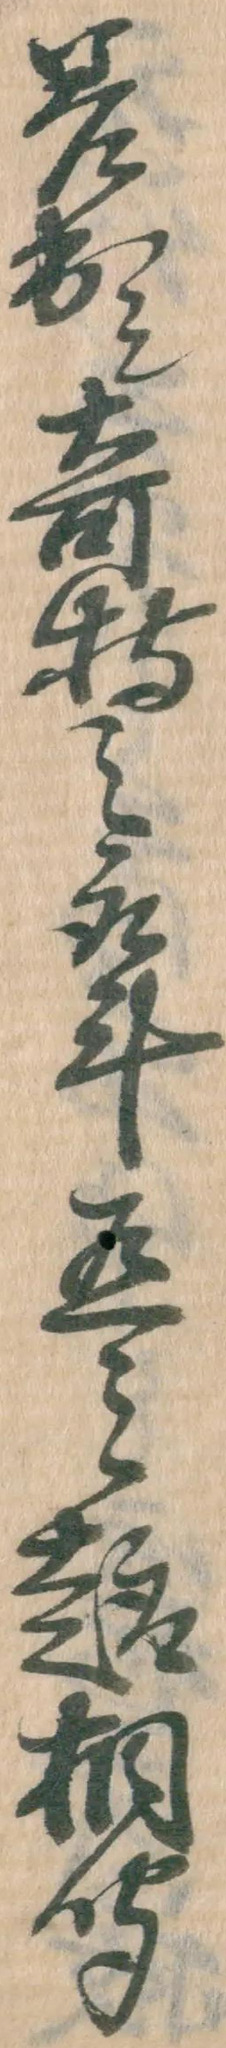差出シ奇特之取計有之趣相聞
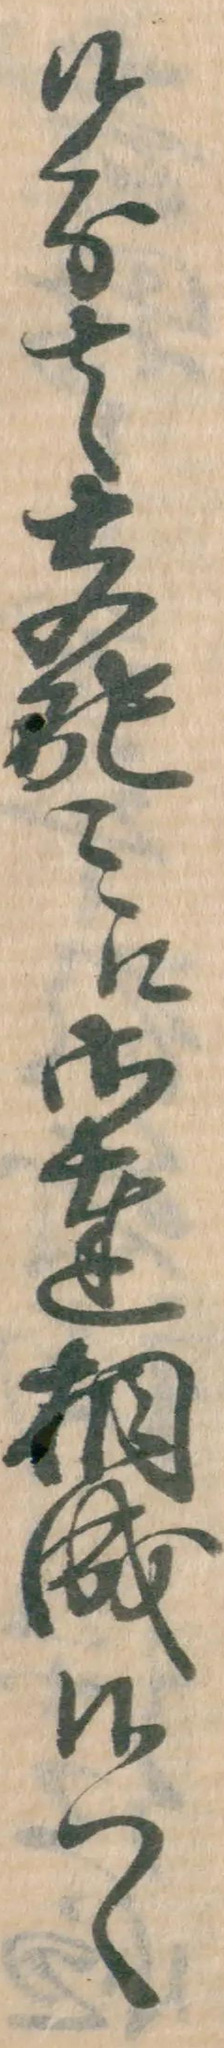候分は支配々え御達相成候ハヽ

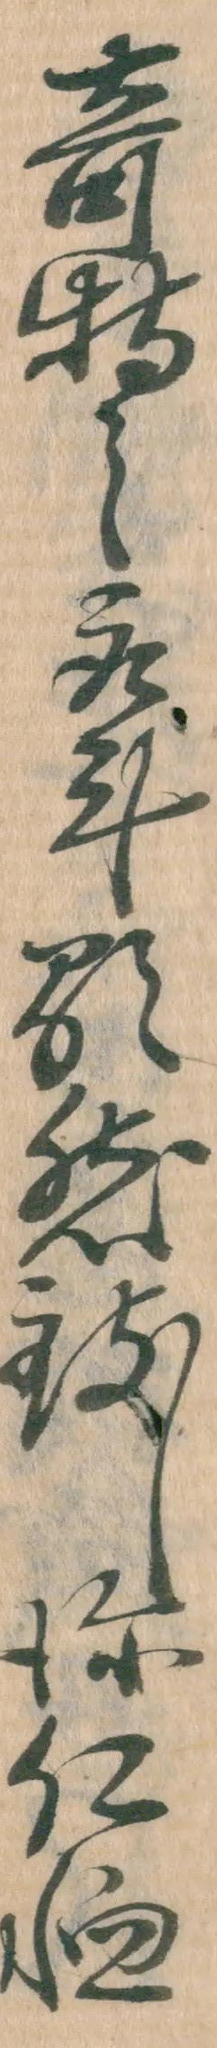奇特之取計顕然致し弥仁恤
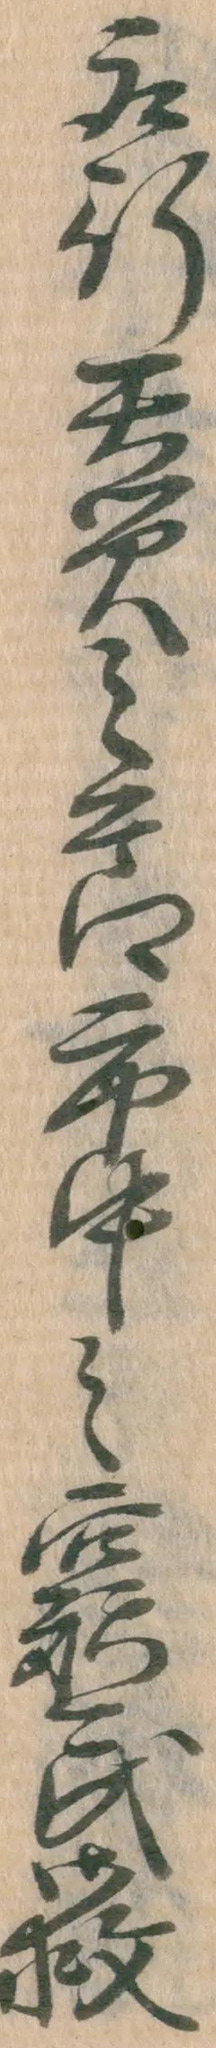取行天災之節市中之窮民御救
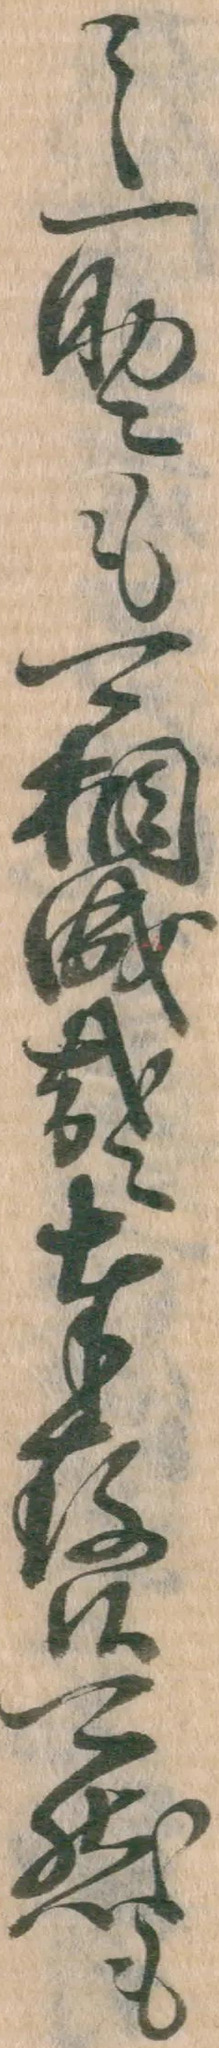之一助ニも可相成哉ニ奉存候可然も
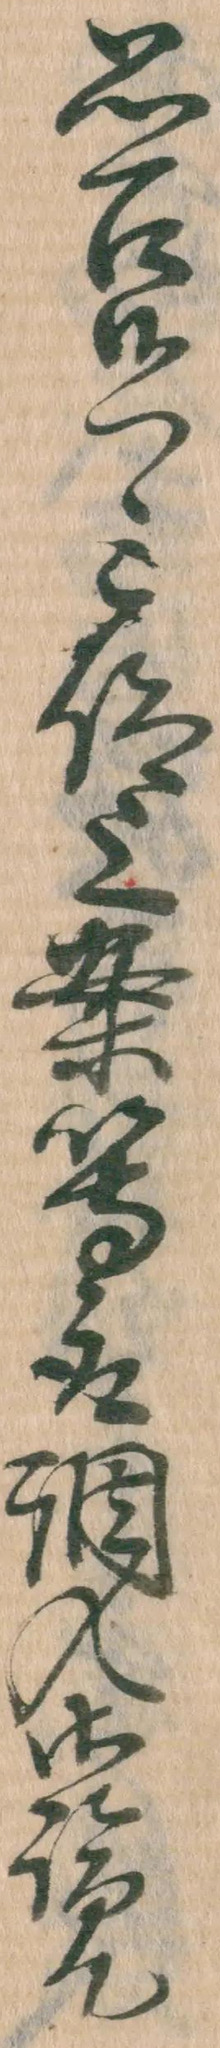思召候ハヽ被仰上案等取調入御覧
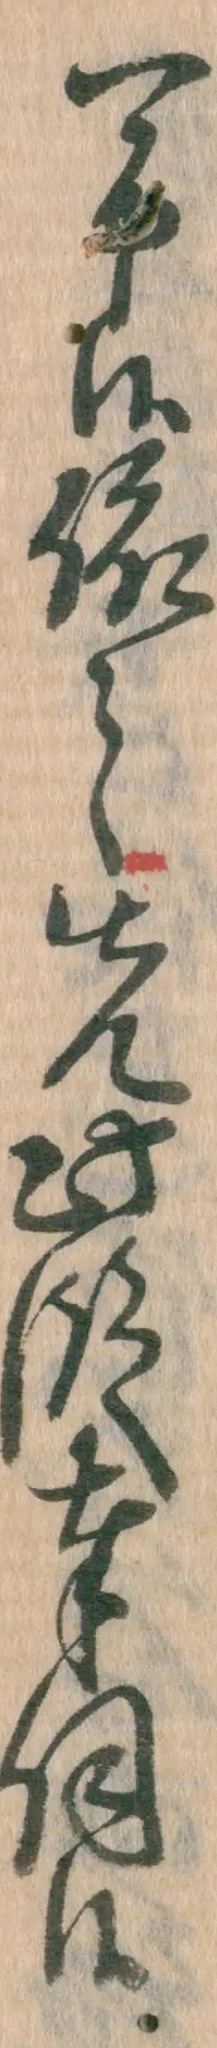可申候依之先此段奉伺候
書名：武家方并寺院等ニテ施差出候一件
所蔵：国立国会図書館 National Diet Library, JAPAN
